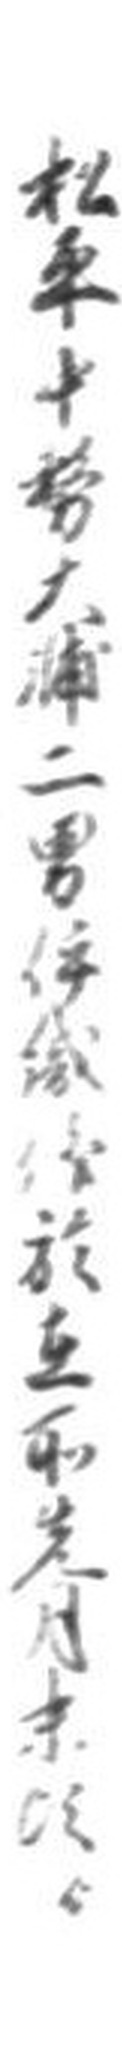松平中務大輔二男伊織儀於在所先月末頃ゟ
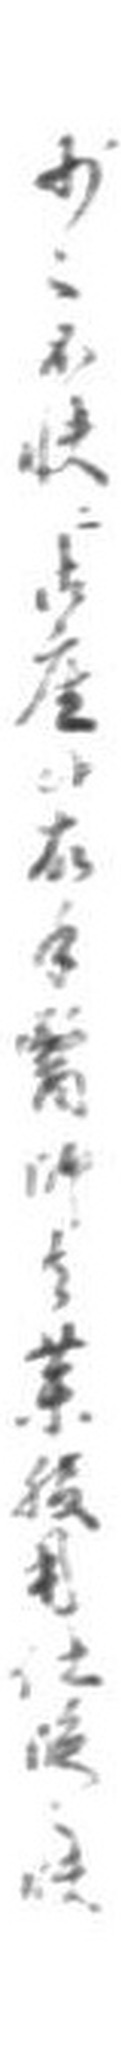少々不快ニ御座候故手医師共薬服用仕段々快
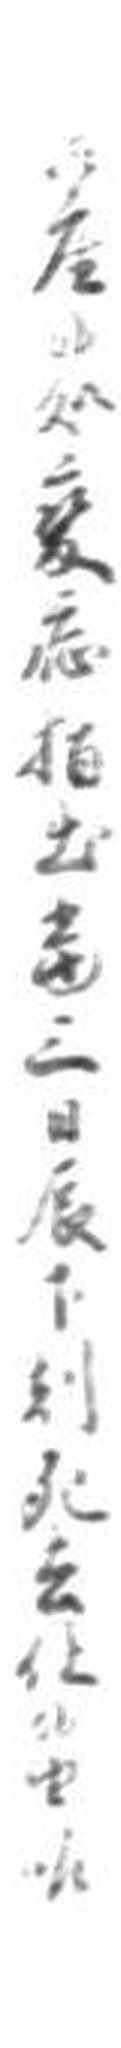御座候処変症指出当三日辰下刻死去仕候由乍
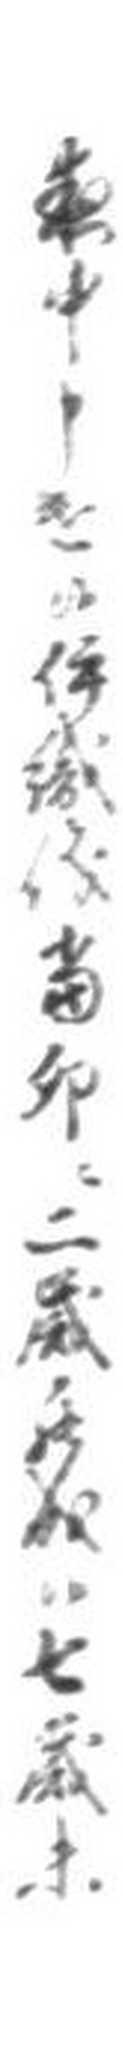夜中申遣候伊織儀当卯ニ二歳罷成候七歳未
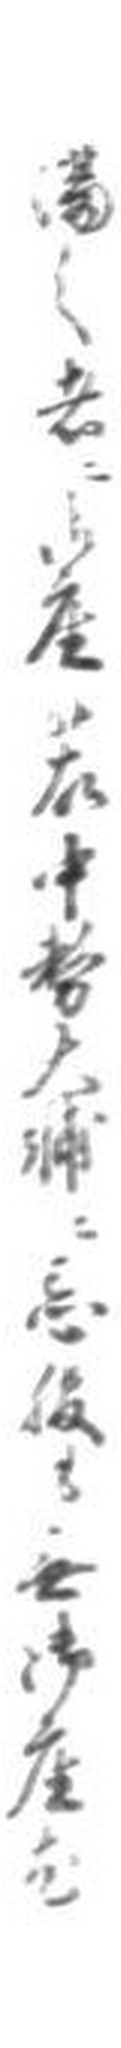満之者ニ御座候故中務大輔ニ忌服も無御座尤
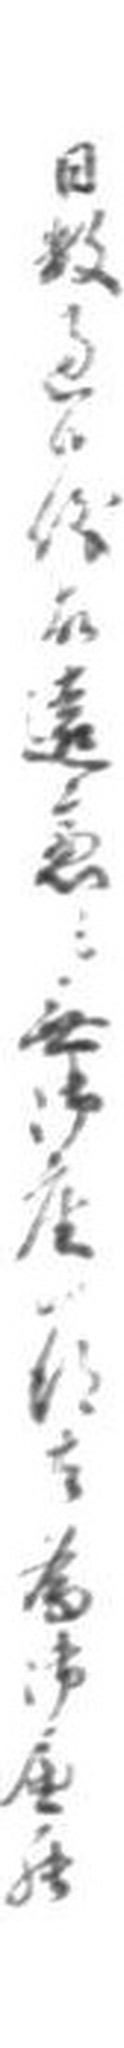日数過候儀故遠慮も無御座候得共為御届罷

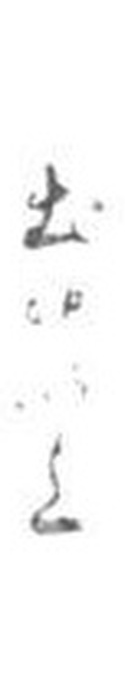出候以上
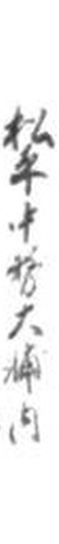松平中務大輔殿
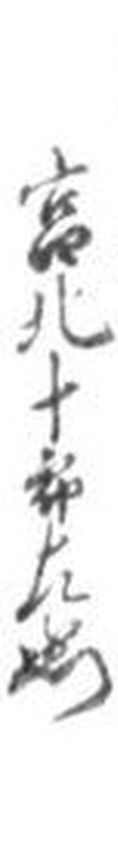宮北十郎左衛門
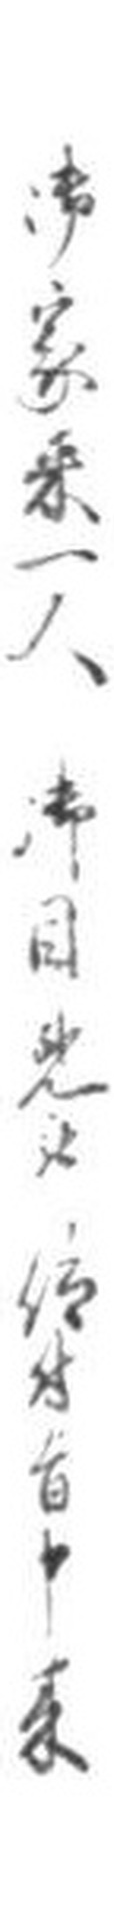御家来一人御目見被仰付旨申来
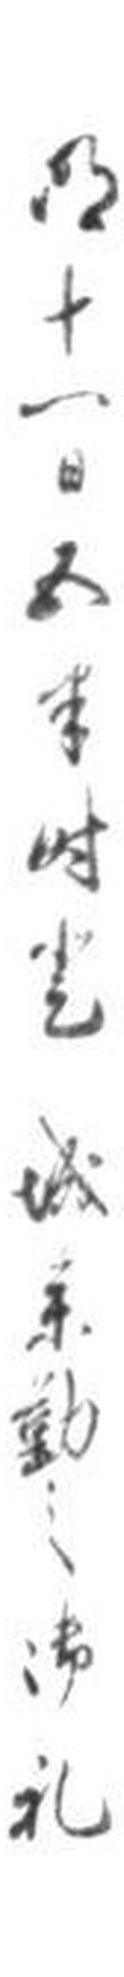明十一日五半時登城参勤之御礼
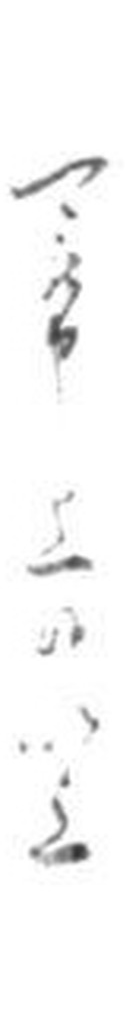可被申上候以上
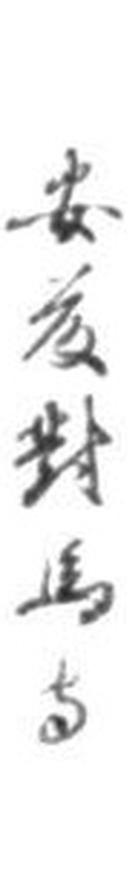安藤対馬守
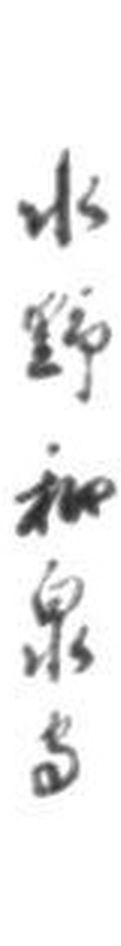水野和泉守
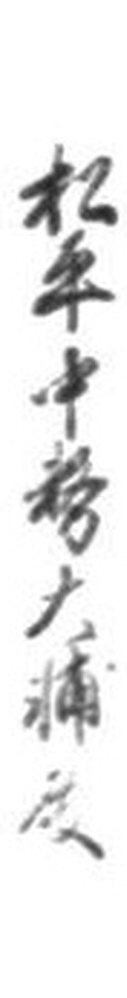松平中務大輔殿
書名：家譜 三十六 宗昌公 従享保八年到同九年
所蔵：福井県文書館 Fukui Prefectural Archives
